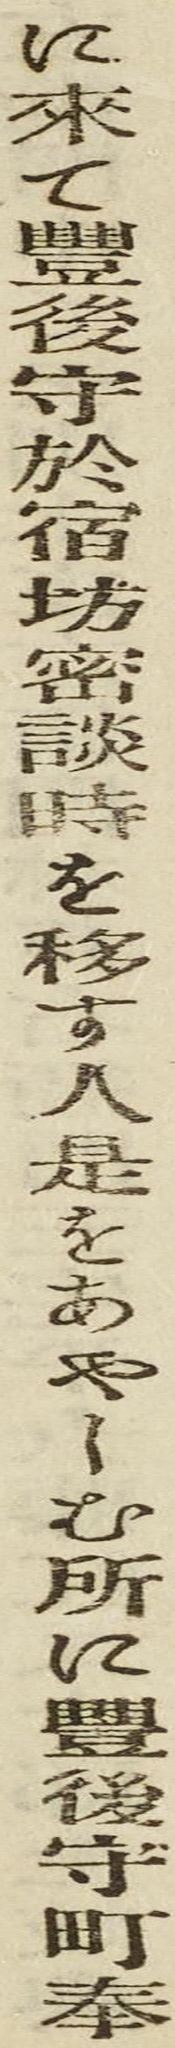に来て豊後守於宿坊密談時を移す人是をあやしむ所に豊後守町奉
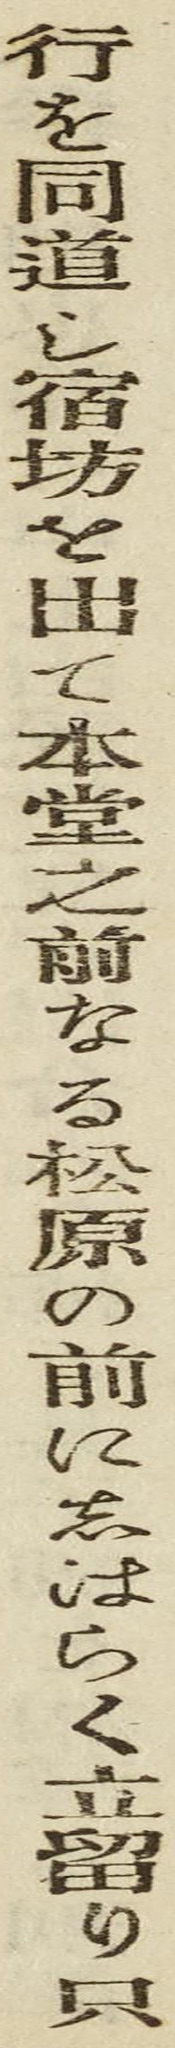行を同道し宿坊を出て本堂之前なる松原の前にしはらく立留り只
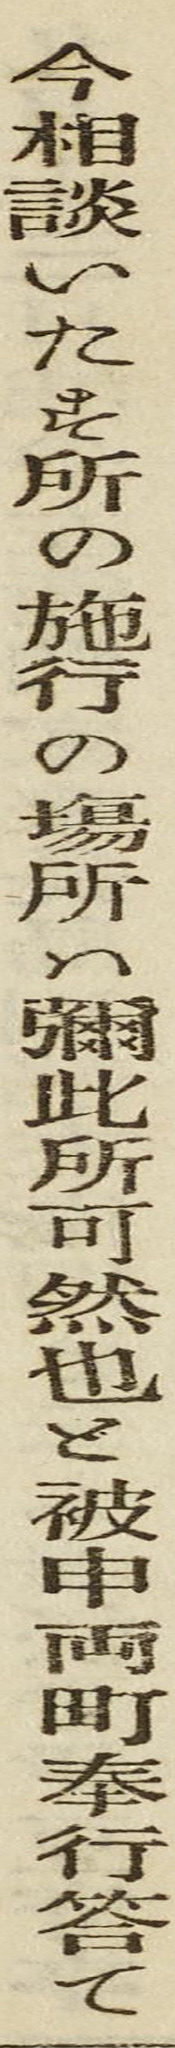今相談いたす所の施行の場所は弥此所可然也と被申両町奉行答て
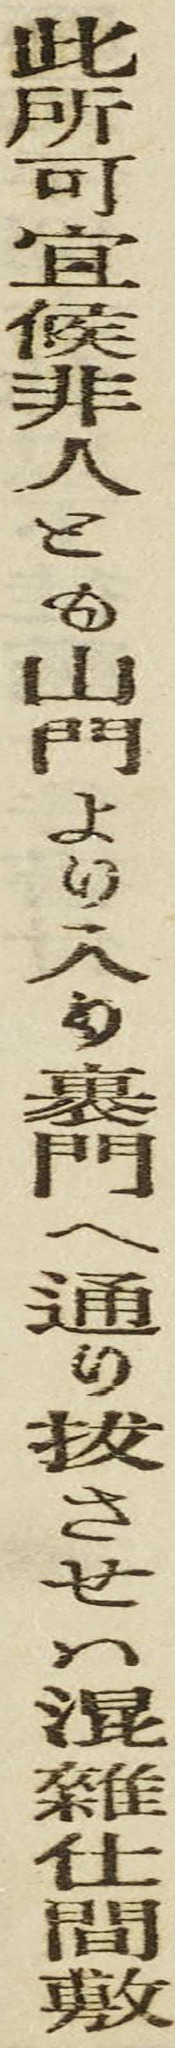此所可宜候非人とも山門より入り裏門へ通り抜させは混雑仕間敷
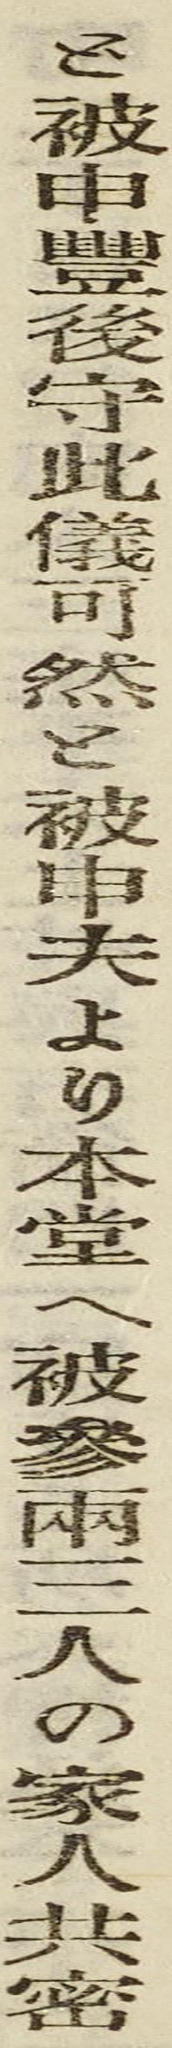と被申豊後守此儀可然と被申夫より本堂へ被参両三人の家人共密
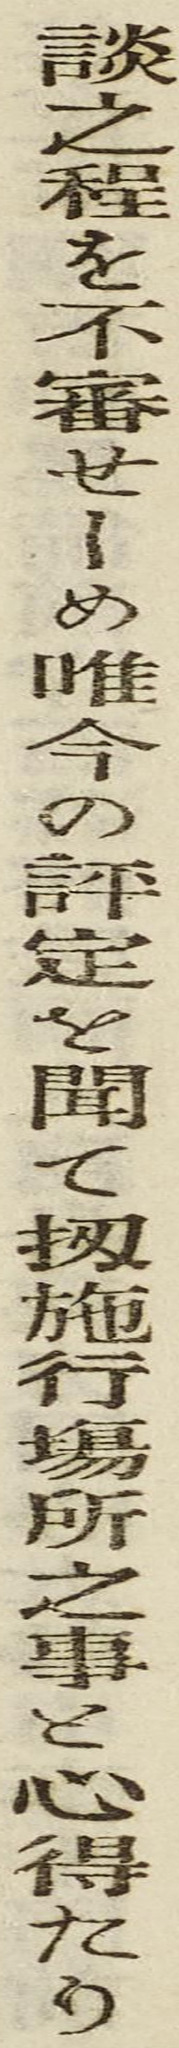談之程を不審せしめ唯今の評定を聞て扨施行場所之事を心得たり
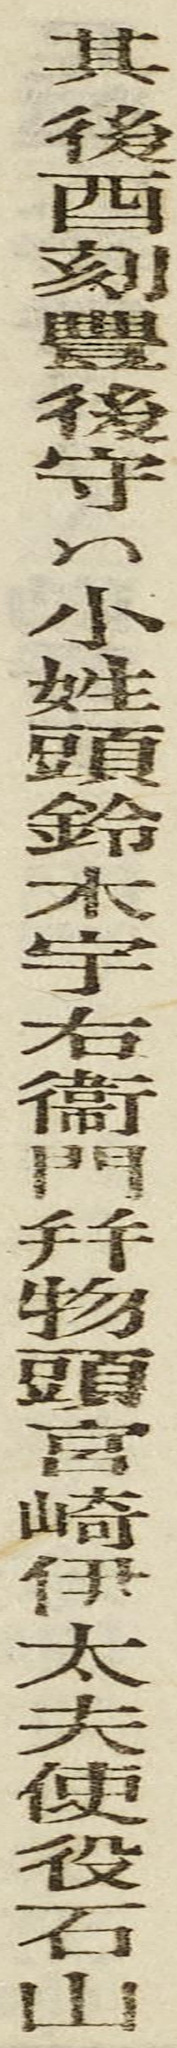其後酉刻豊後守は小姓頭鈴木宇右衞門幷物頭宮崎伊太夫使役石山
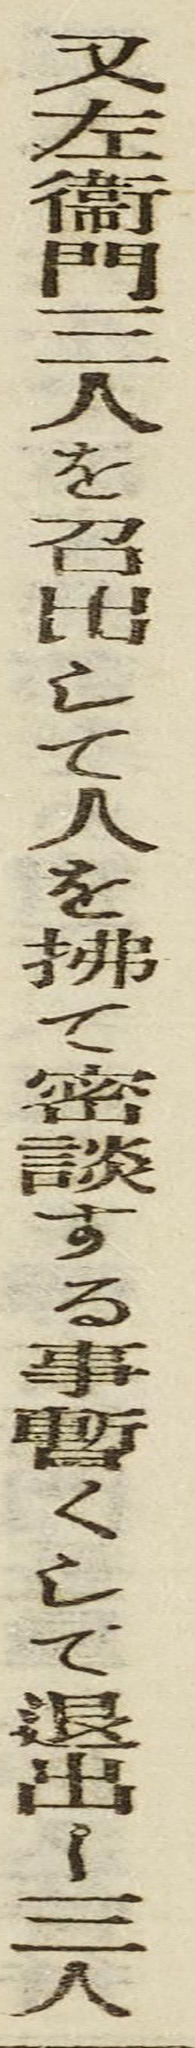又左衞門三人を召出して人を払て密談する事暫くして退出し三人
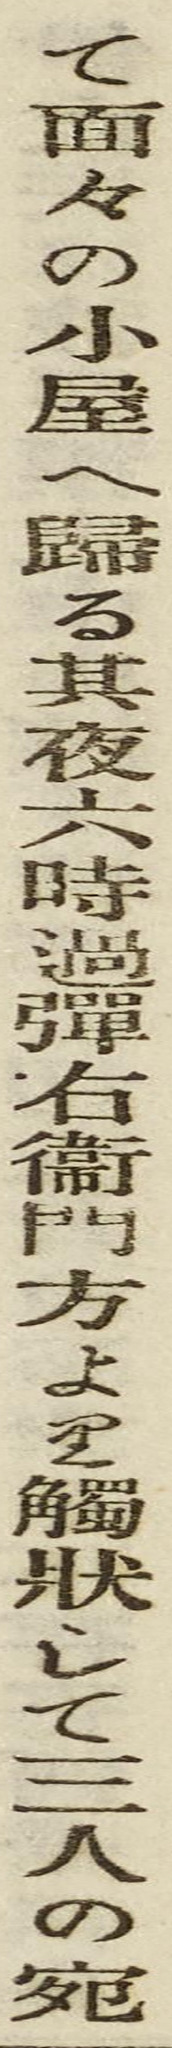て面々の小屋へ帰る其夜六時過弾右衞門方より触状して三人の宛
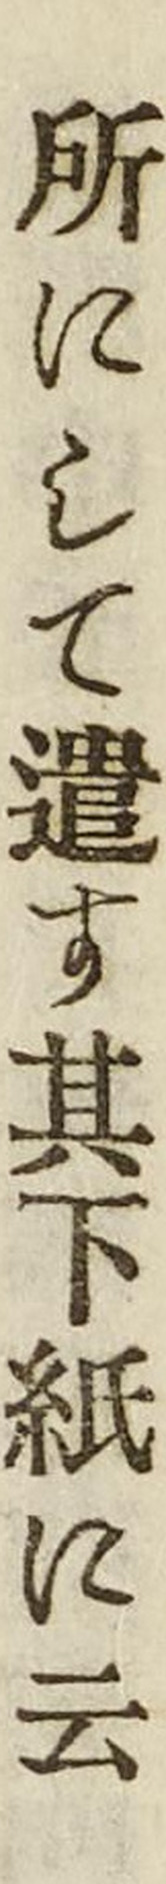所にして遺す其下紙に云
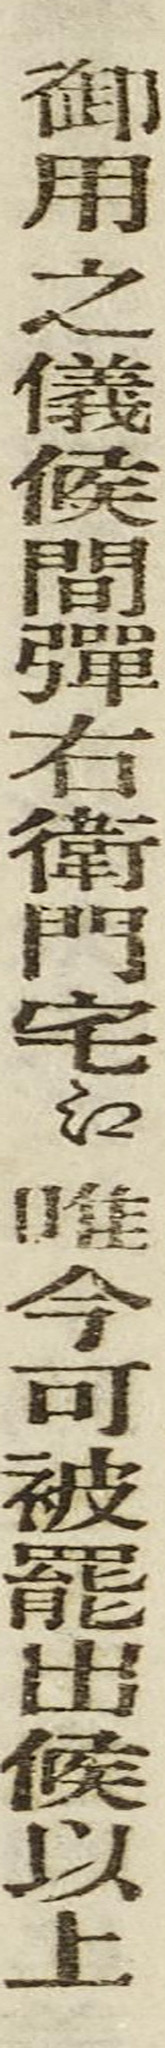御用之儀候間弾右衛門宅江唯今可被罷出候以上
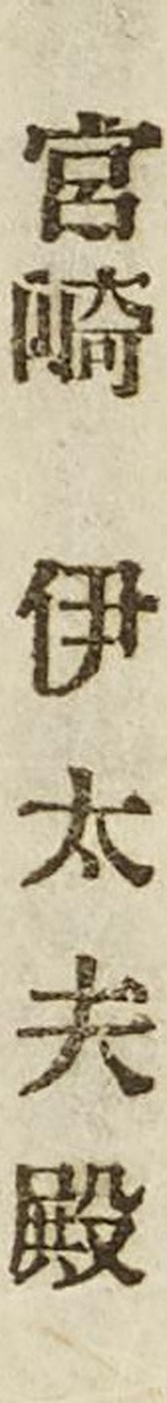宮崎伊太夫殿
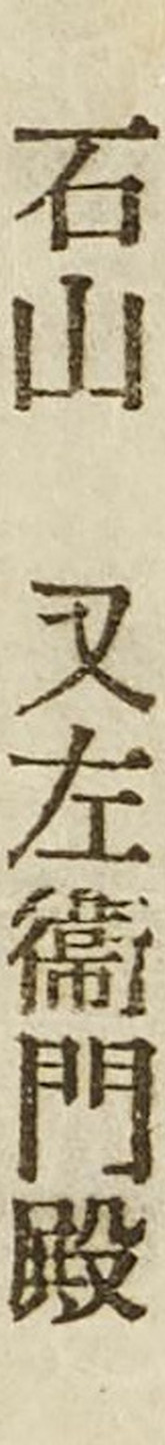石山又左衞門殿

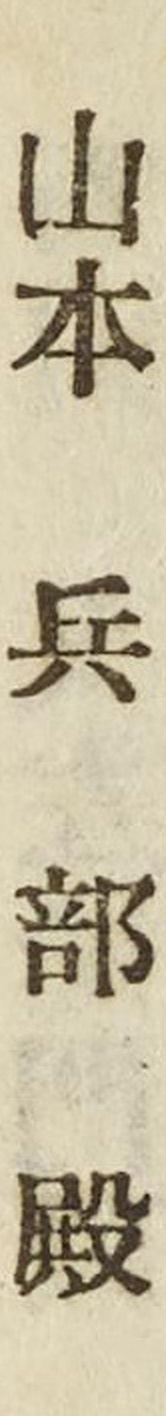山本兵部殿
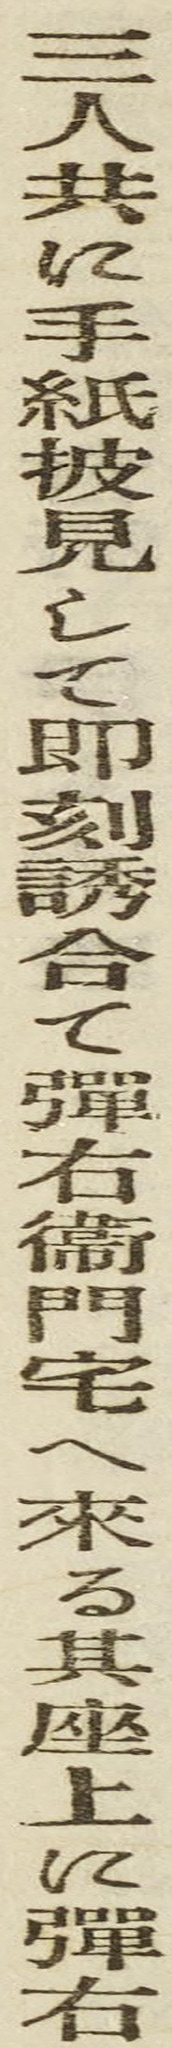三人共に手紙披見して即刻誘合て弾右衞門宅へ来る其座上に弾右
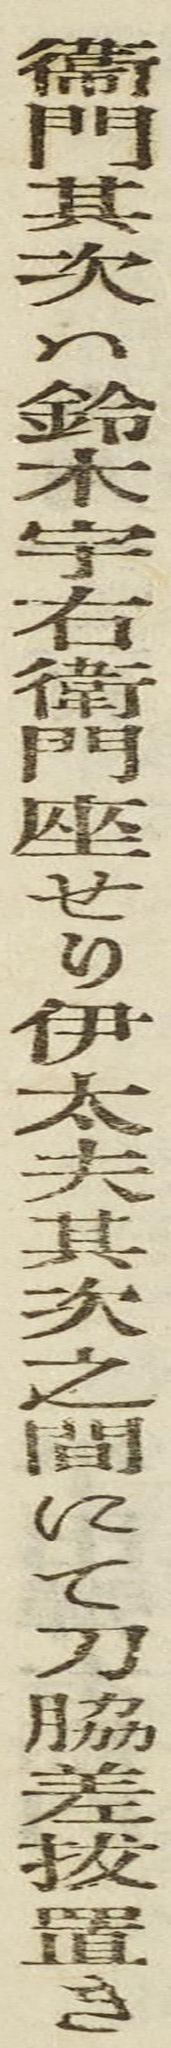衞門其次は鈴木宇右衛門座せり伊太夫其次之間にて刀脇差抜置き
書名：史籍集覽　朝鮮陣古文・細井廣澤記・颶風紀事・天明七年將軍宣下次第書　全
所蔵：東京大学地震研究所図書室 Earthquake Research Institute Library, The University of Tokyo, JAPAN
